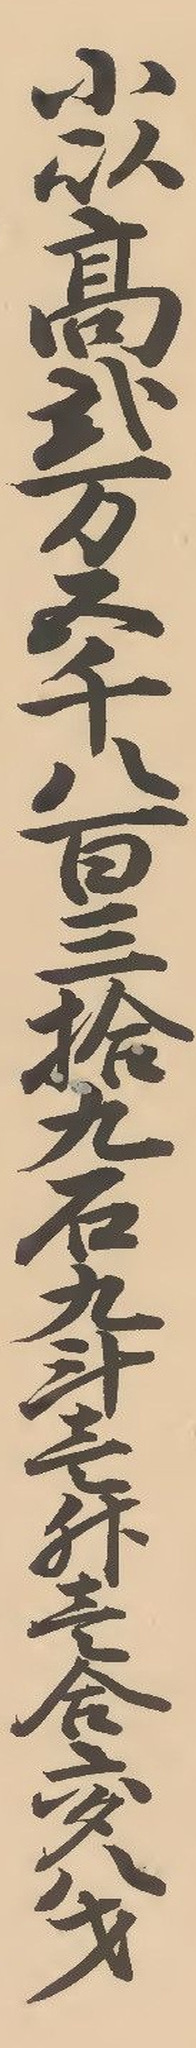小以高弐万五千八百三拾九石九斗壱升壱合六勺八才
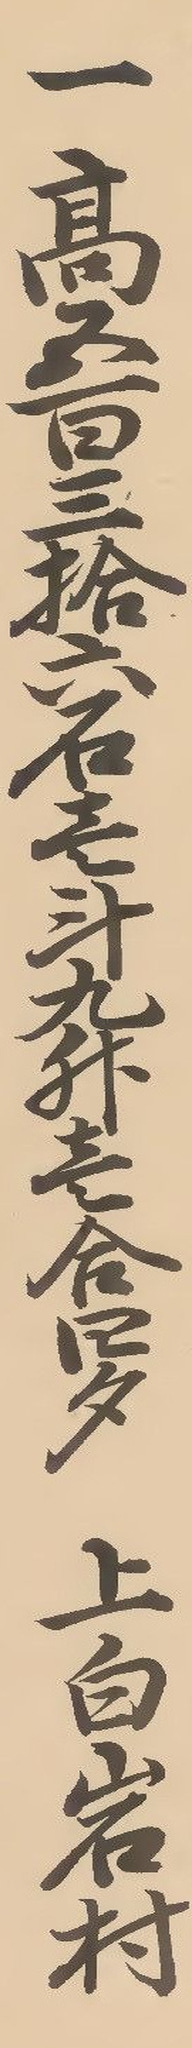一高五百三拾六石壱斗九升壱合四勺上白岩村
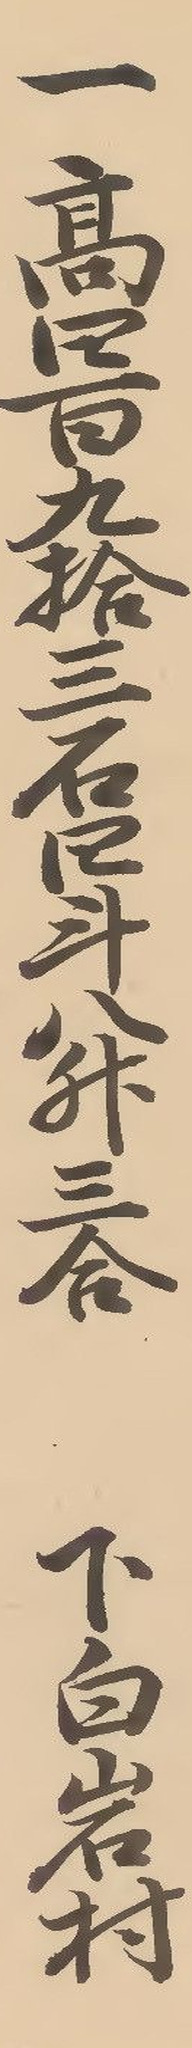一高四百九拾三石四斗八升三合下白岩村
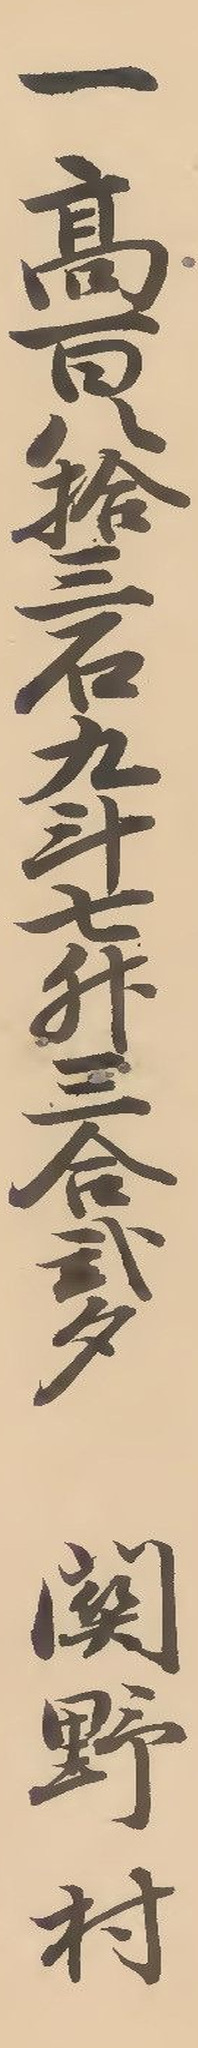一高百八拾三石九斗七升三合弐勺関野村

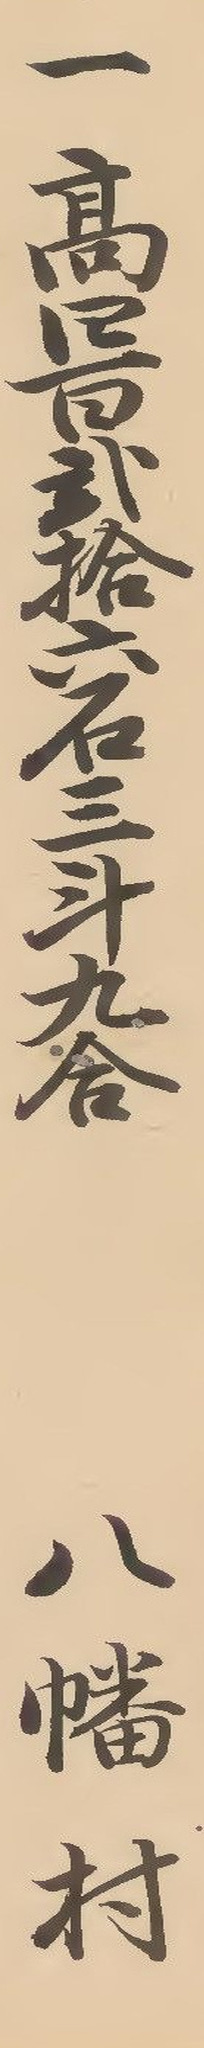一高四百弐拾六石三斗九合八幡村
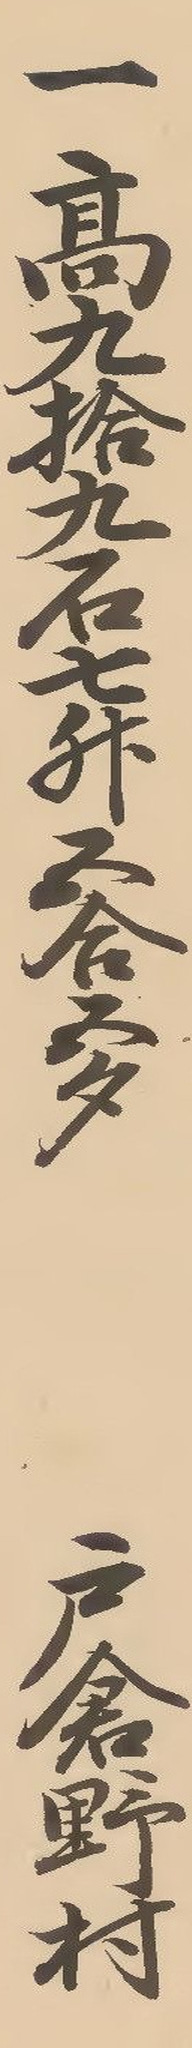一高九拾九石七升五合五勺戸倉野村
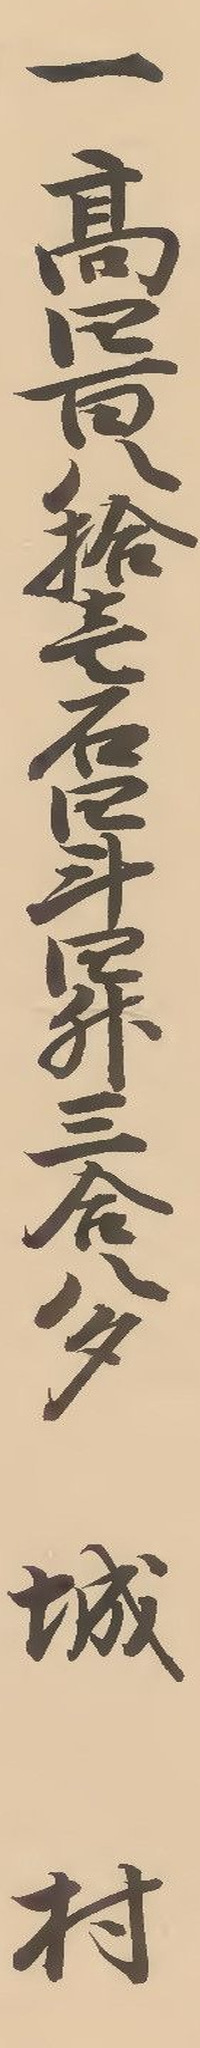一高四百八拾壱石四斗四升三合八勺城村
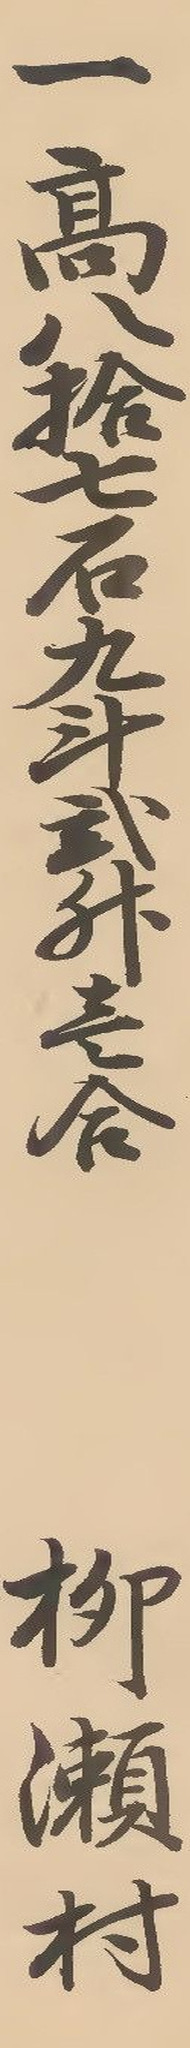一高八拾七石九斗弐升壱合柳瀬村
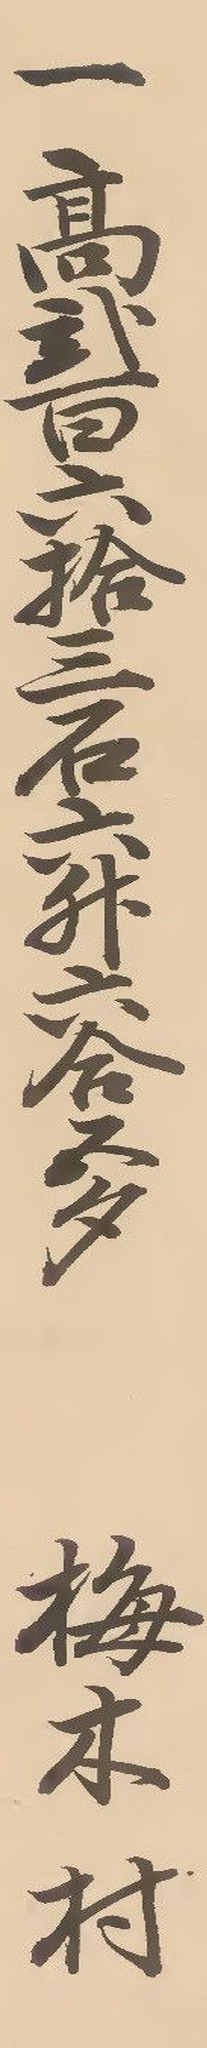一高弐百六拾三石六升六合五勺梅木村
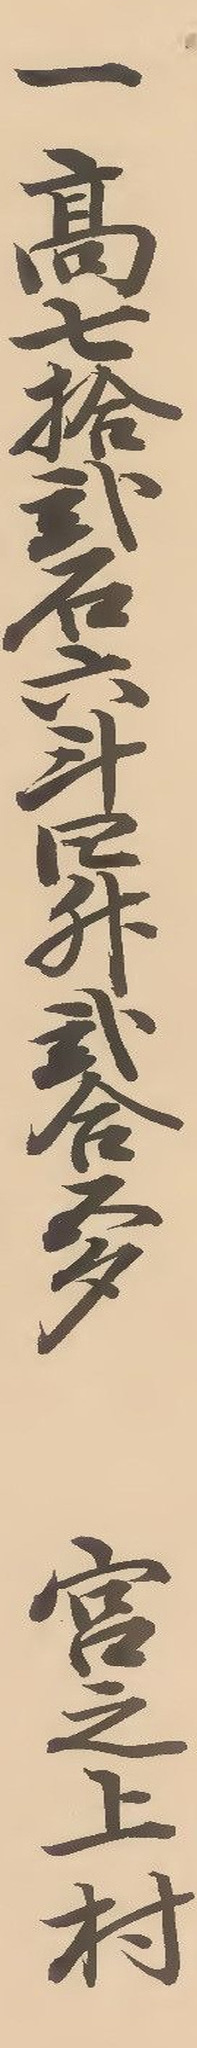一高七拾弐石六斗四升弐合五勺宮之上村
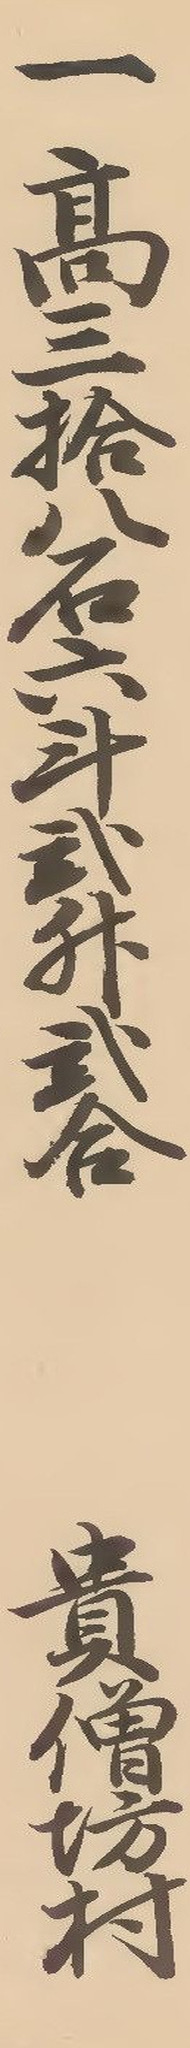一高三拾八石六斗弐升弐合貴僧坊村
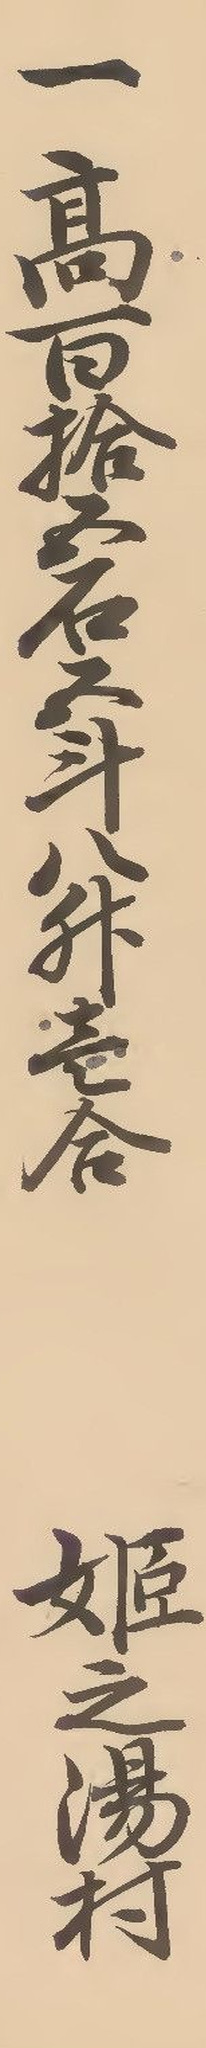一高百拾五石五斗八升壱合姫之湯村

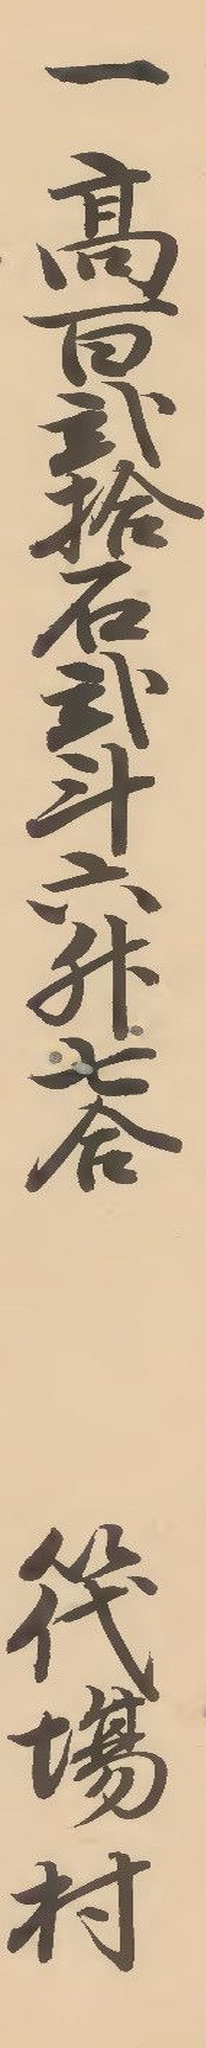一高百弐拾石弐斗六升七合筏場村
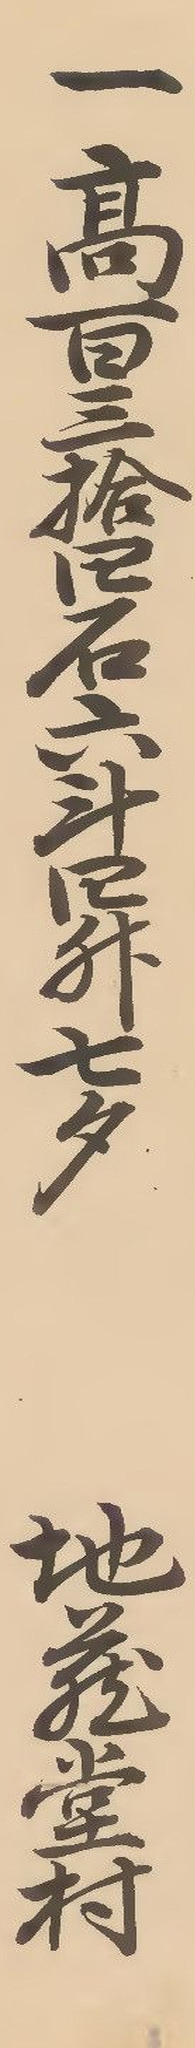一高百三拾四石六斗四升七勺地蔵堂村
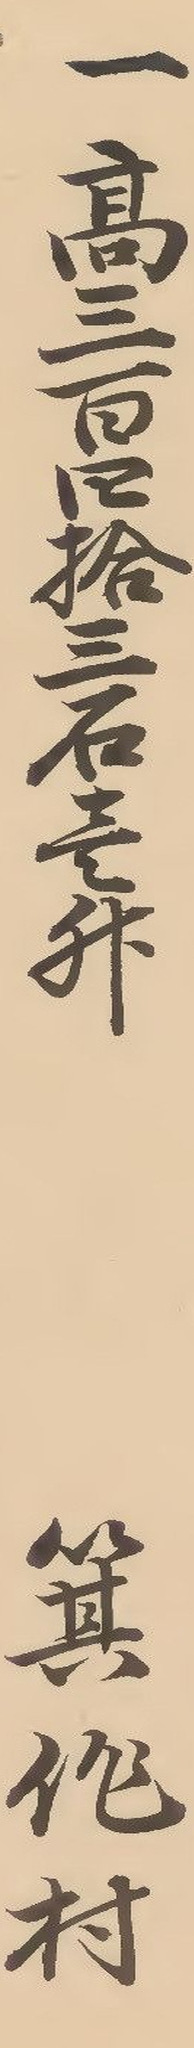一高三百四拾三石壱升箕作村
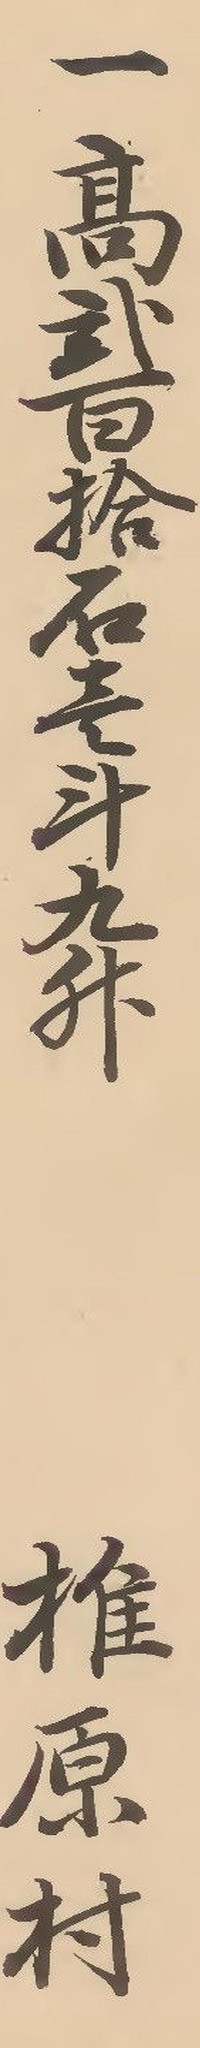一高弐百拾石壱斗九升椎原村
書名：伊豆国郷帳
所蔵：国立公文書館 National Archives of Japan
